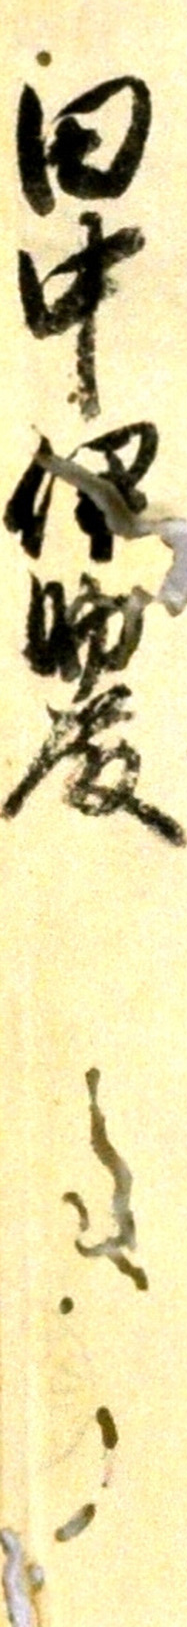田中伊助殿
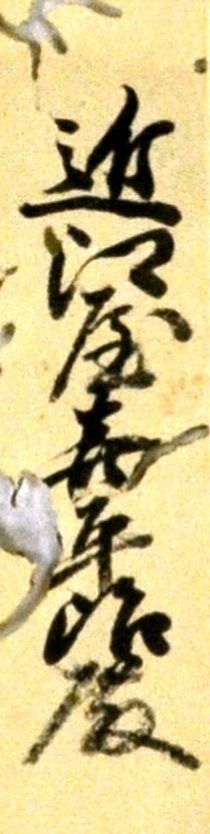近江屋喜平治殿
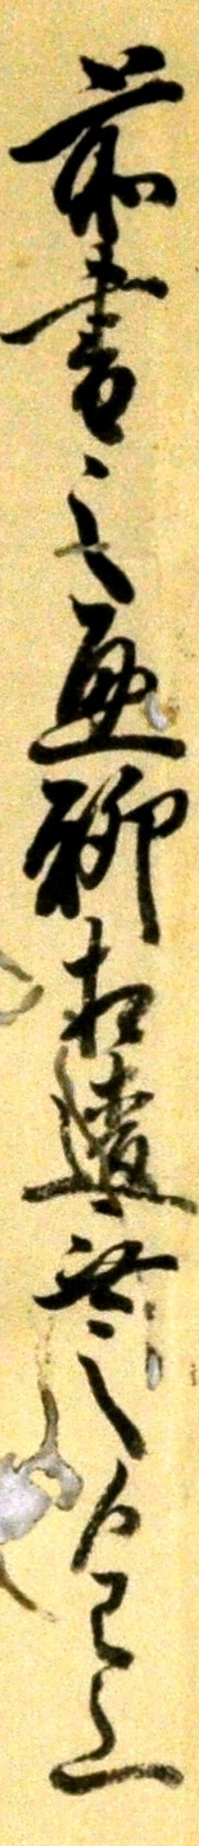前書之通聊相違無之候已上
